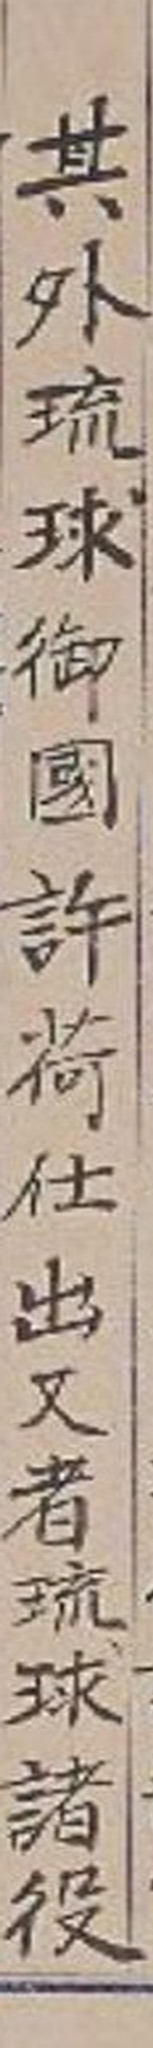其外琉球御國許荷仕出又者琉球諸役
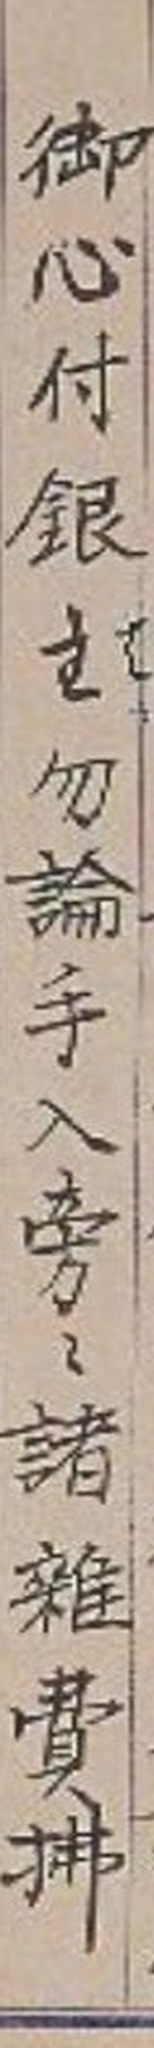御心付銀者勿論手入旁〻諸雜費拂
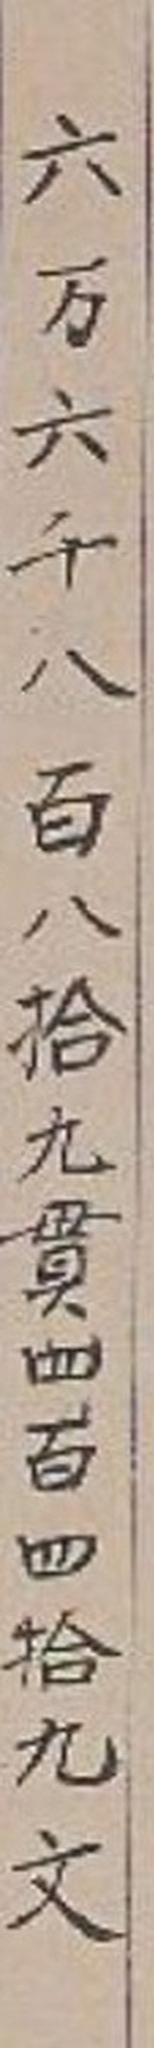六万六千八百八拾九貫四百四拾九文
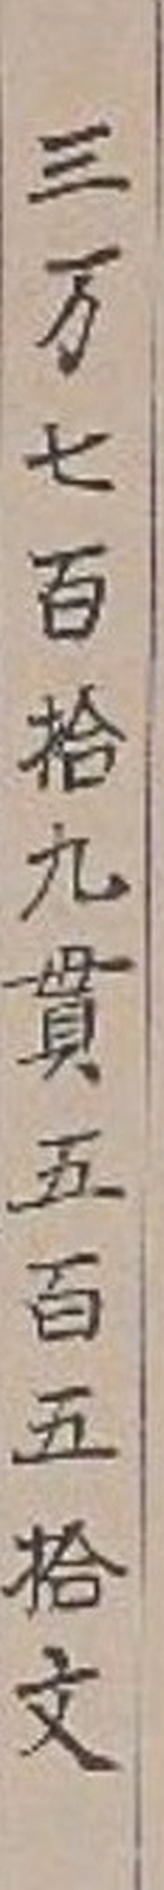三万七百拾九貫五百五拾文
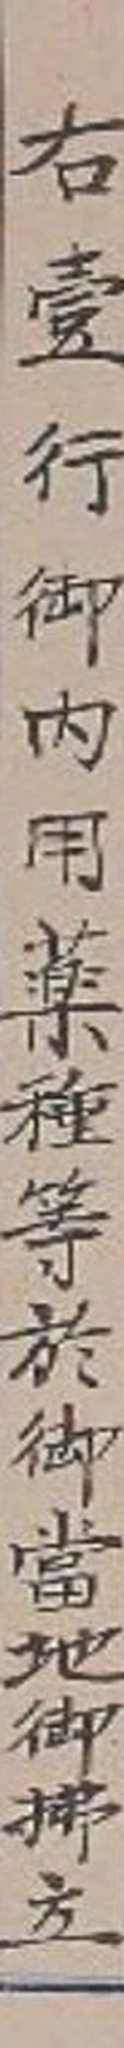右壹行御内用薬種等於御當地御拂辰立

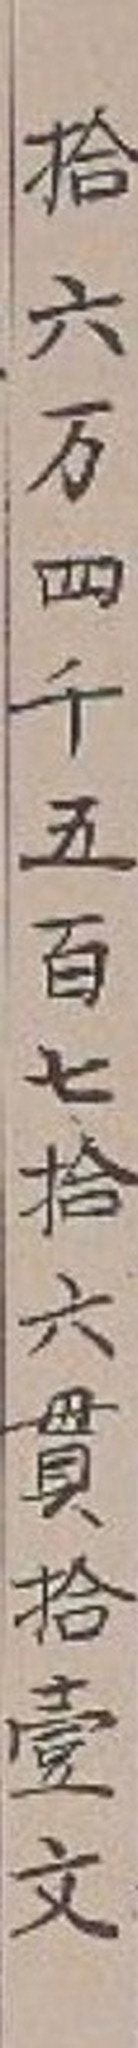拾六万四千五百七拾六貫拾壹文
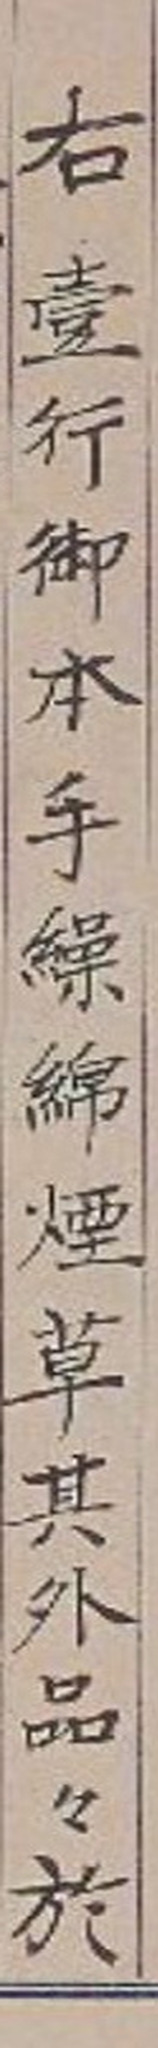右壹行御本手繰綿煙草其外品々於
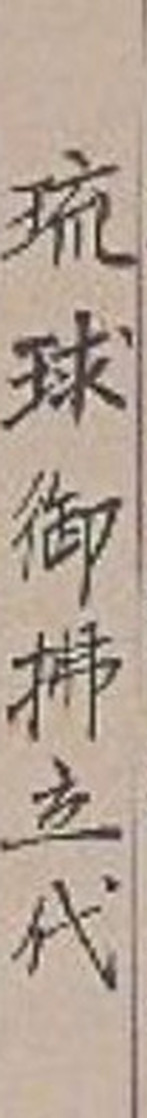琉球御拂立代
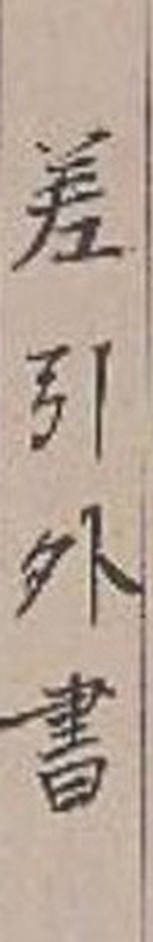差引外書
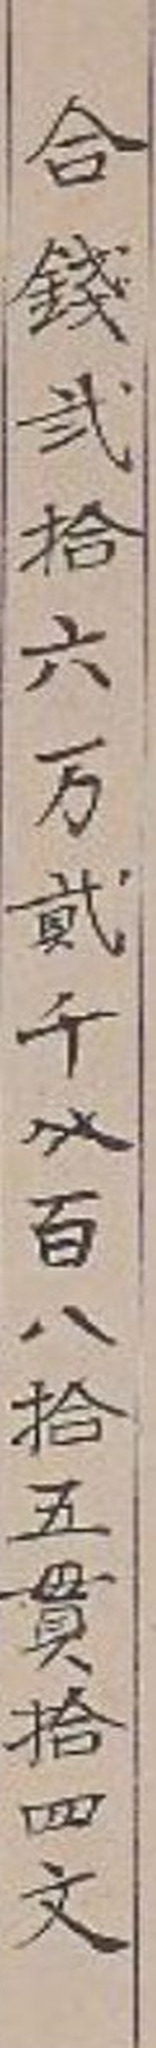合錢弐拾六万貳千百八拾五貫拾四文
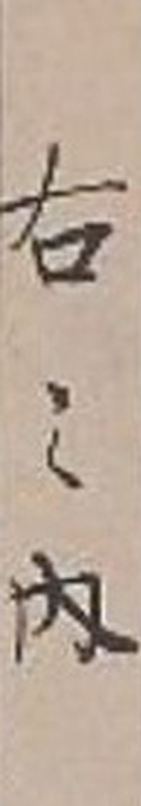右之内
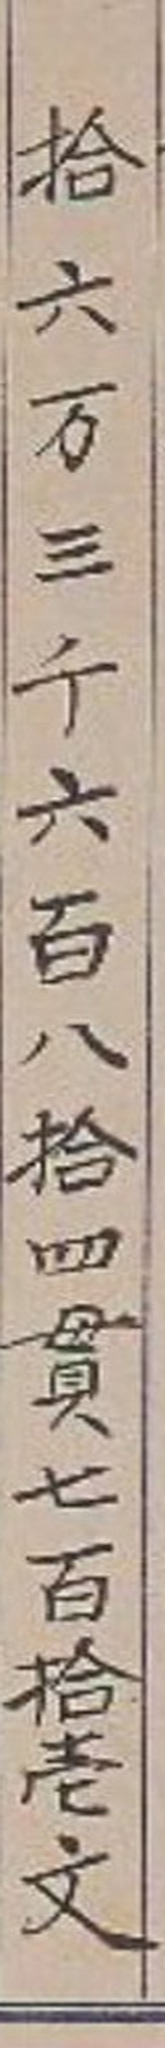拾六万三千六百八拾四貫七百拾壱文
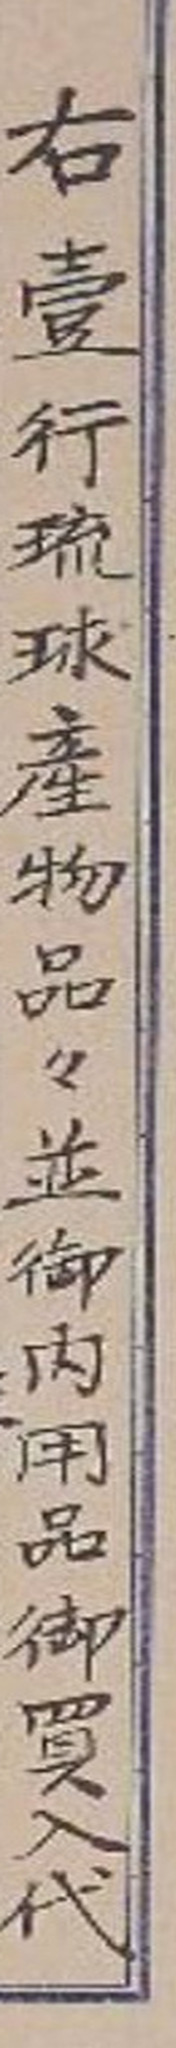右壹行琉球産物品々並御内用品御買入代
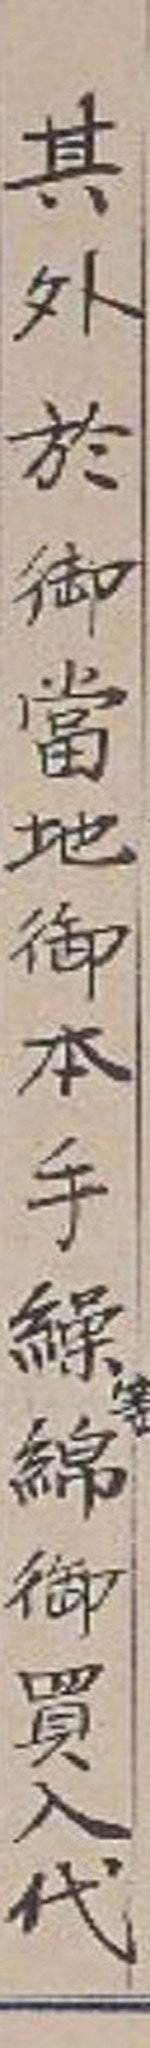其外於御當地御本手繰等綿御買入代
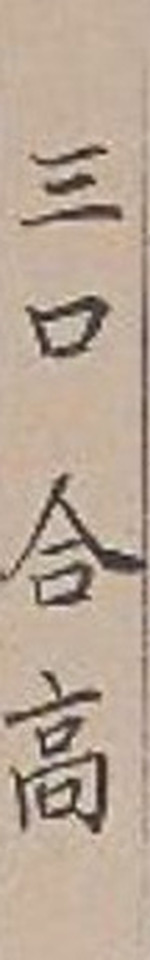三口合高
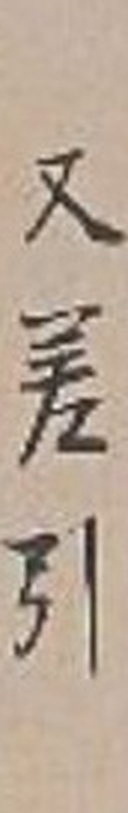又差引
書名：琉球産物於長崎拂立並本手品利潤総帖 弘化四年より酉年迄
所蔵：University of the Ryukyus Library
